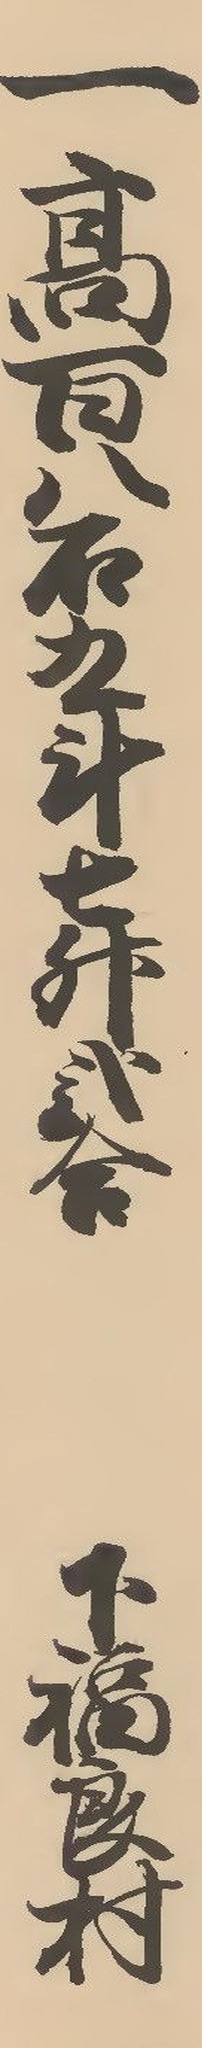一た百八石九斗七升弐合下福良村
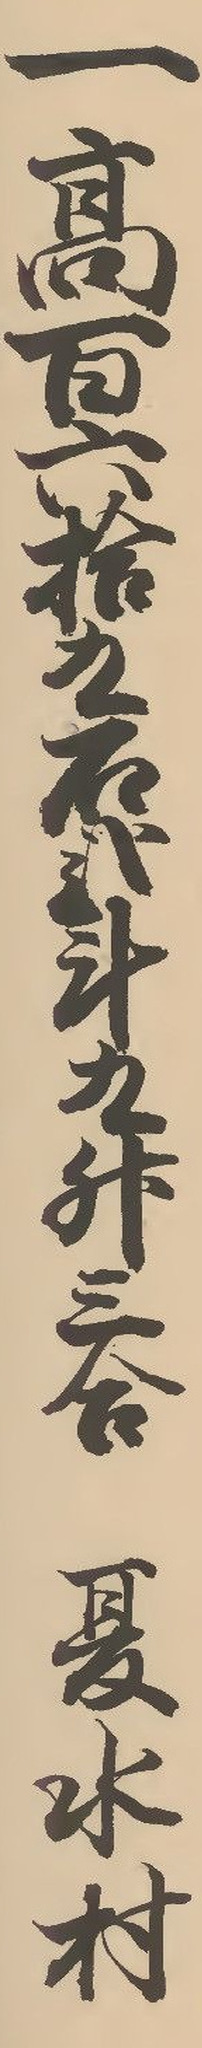一髙百六拾九石弐斗九升三合夏水村
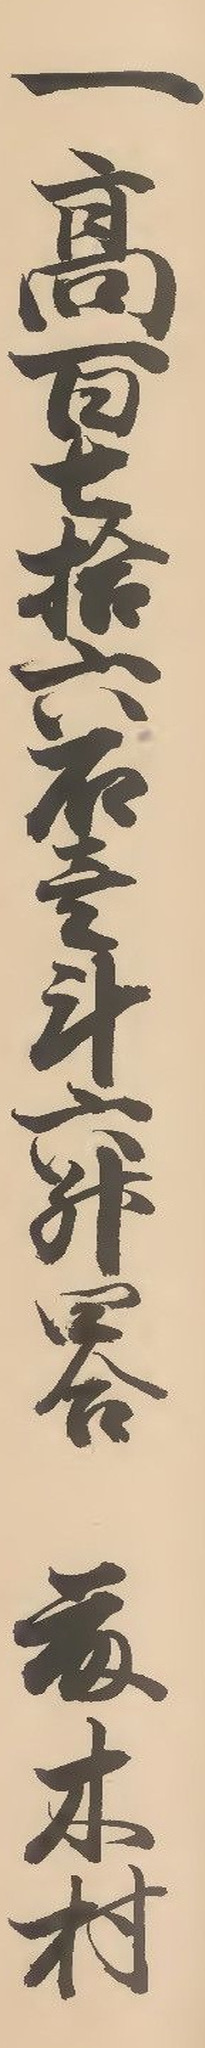一髙百七拾六石壱斗六升四合藤木村
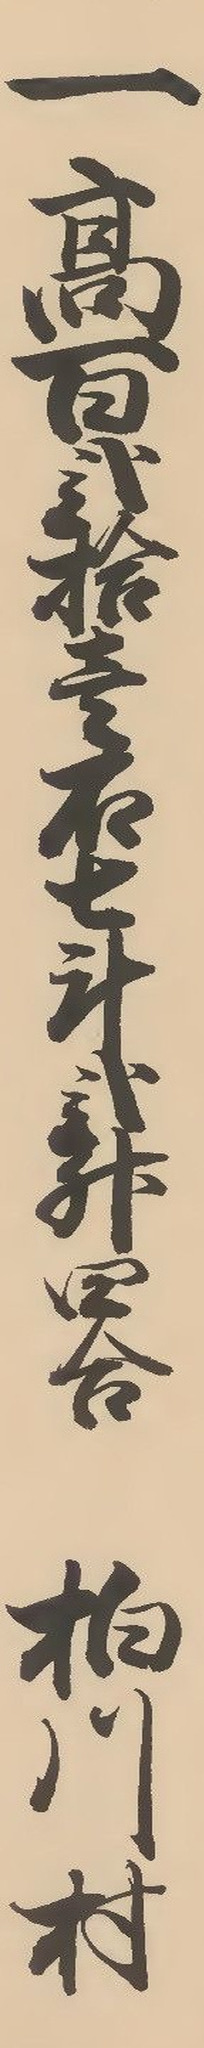一髙百弐拾壱石七斗弐升四合柏川村
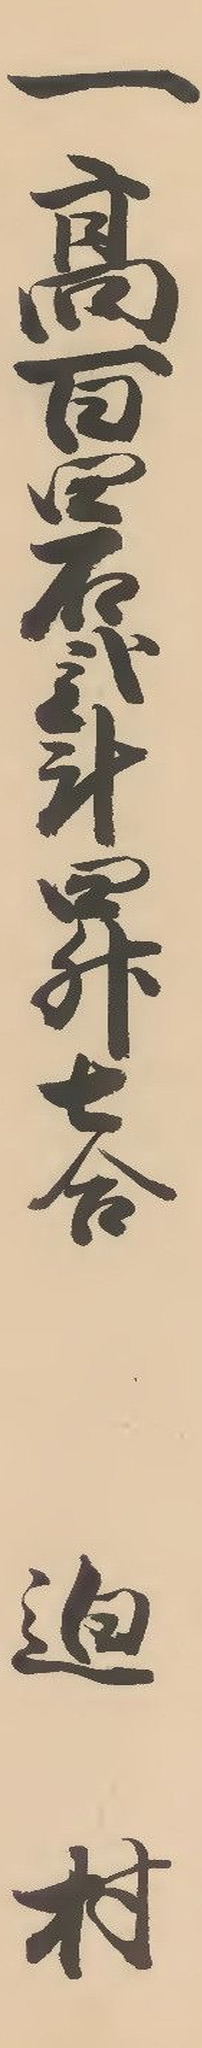一髙百四石弐斗四升七合迫村
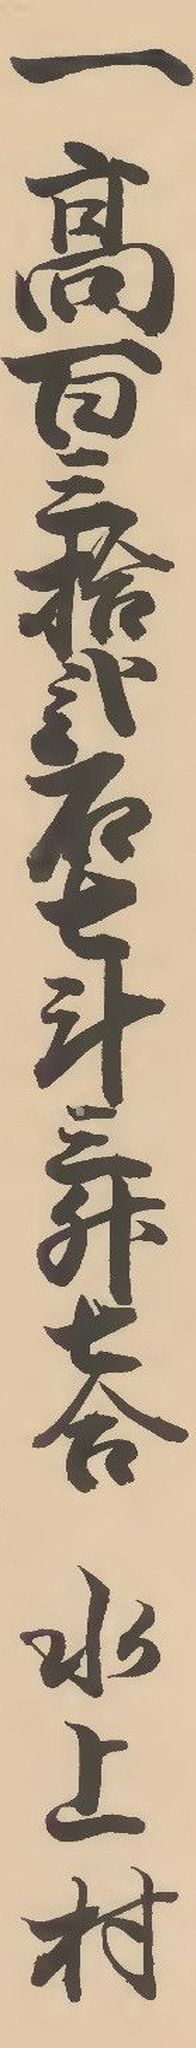一髙百三拾弐石七斗三升七合水上村

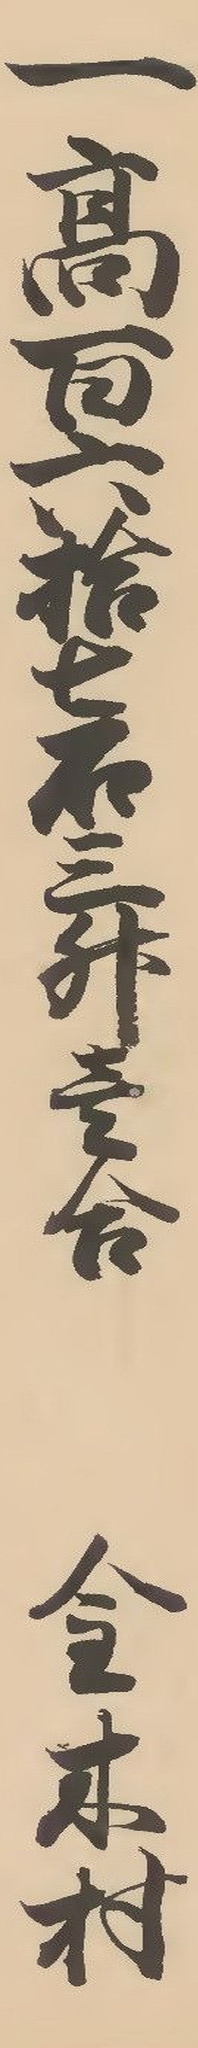一髙百六拾七石三升壱合金木村
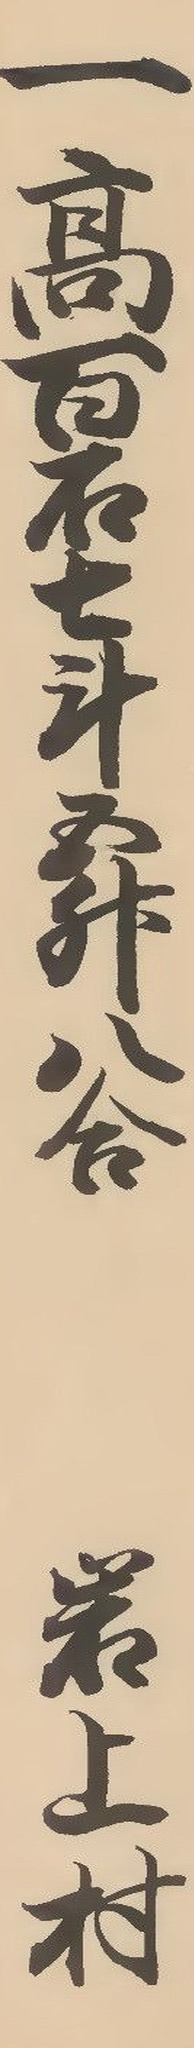一髙百石七斗五升八合岩上村
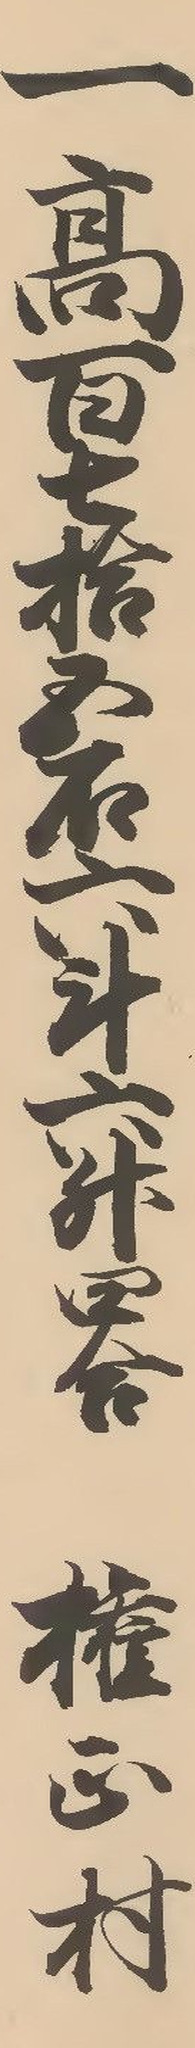一髙百七拾五石六斗六升四合権正村
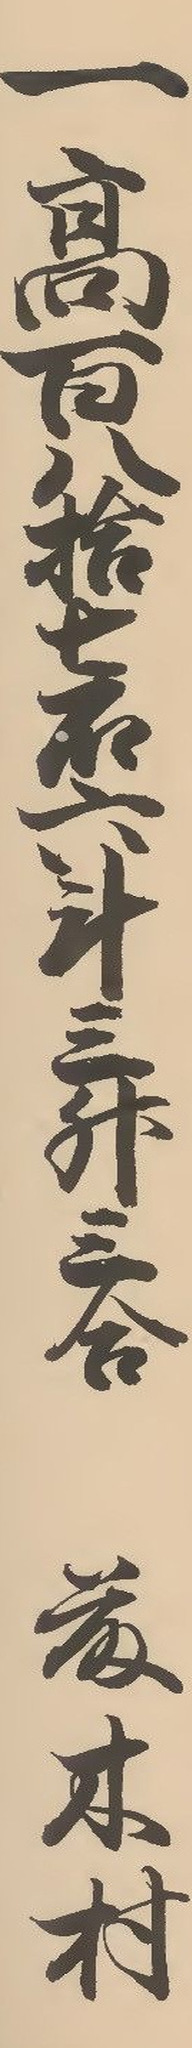一髙百八拾七石六斗三升三合藤木村
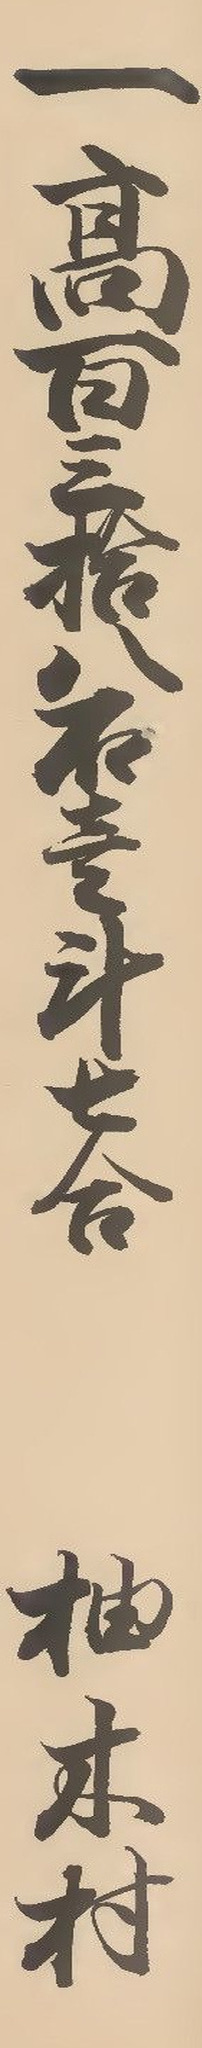一髙百三拾八石壱斗七合柚木村
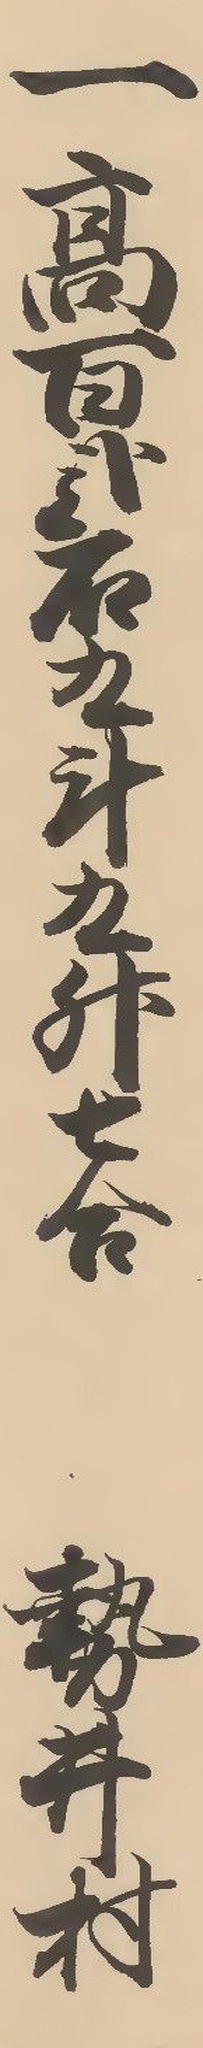一髙百弐石九斗九升七合勢井村
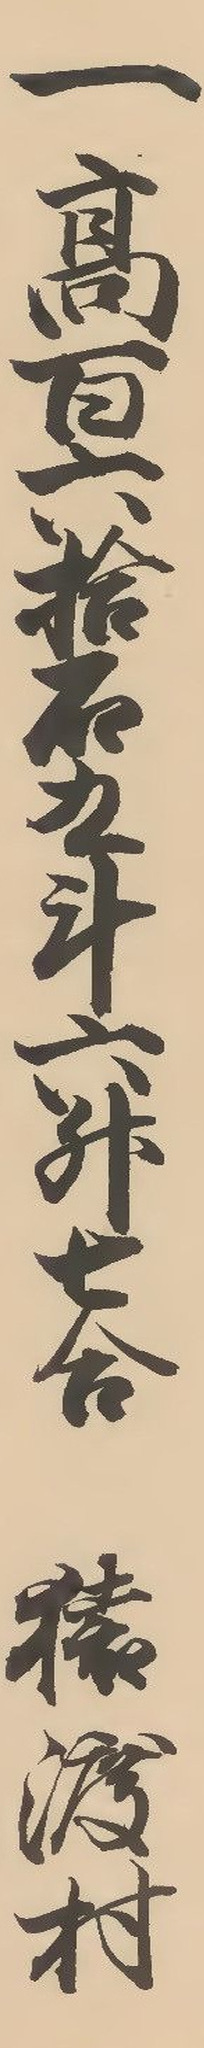一髙百六拾石九斗六升七合猿渡村
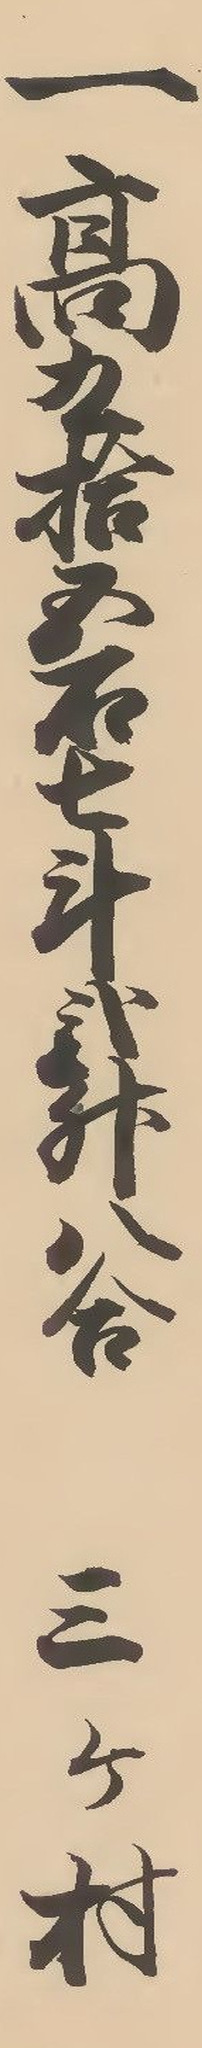一髙九拾五石七斗弐升八合三ケ村

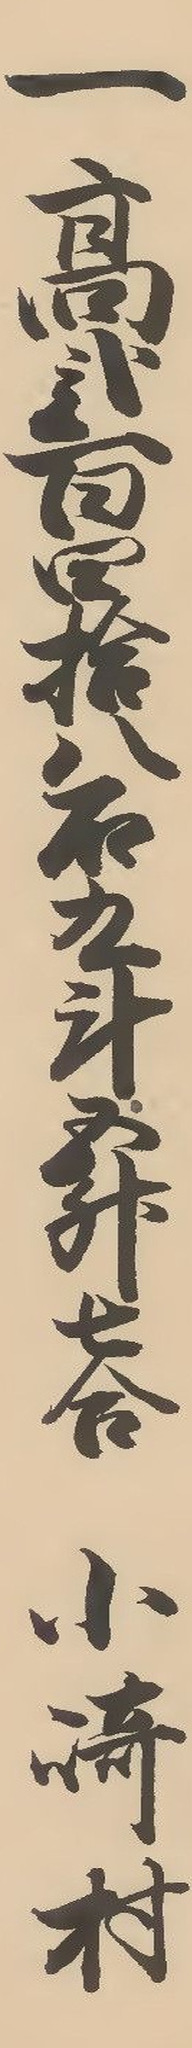一髙弐百四拾八石九斗五升七合小崎村
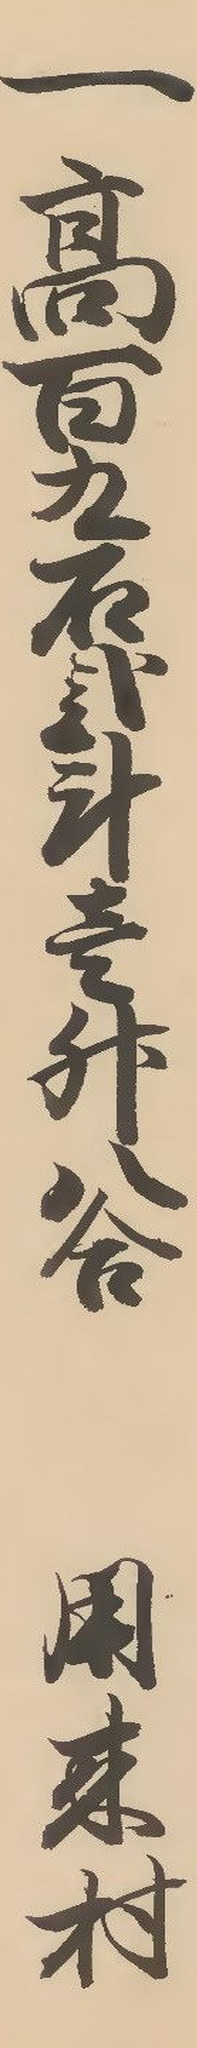一髙百九石弐斗壱升八合用來村
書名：肥後国郷帳
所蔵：国立公文書館 National Archives of Japan
